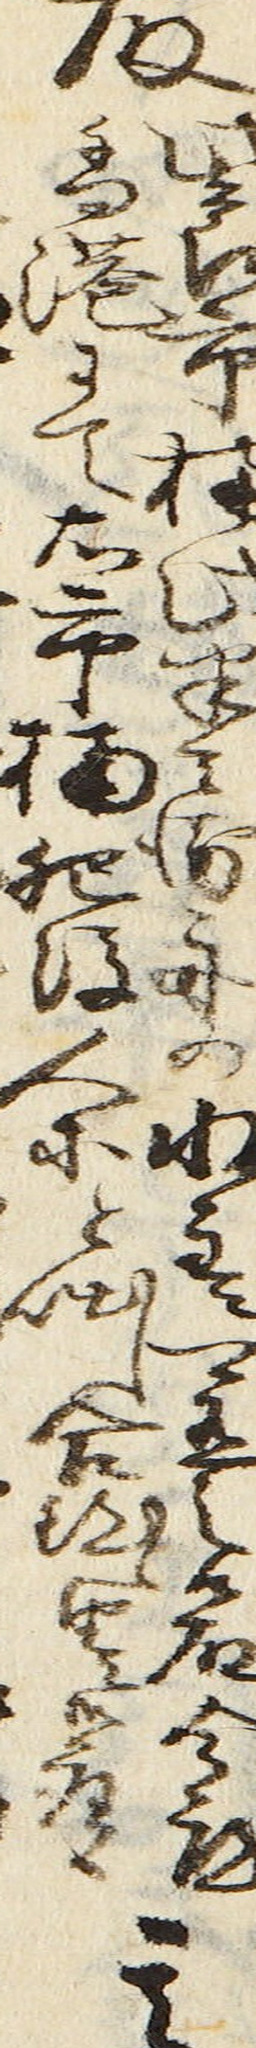香港にて右市楠肥後人等と咄し合致由ニ御座候其儘乗
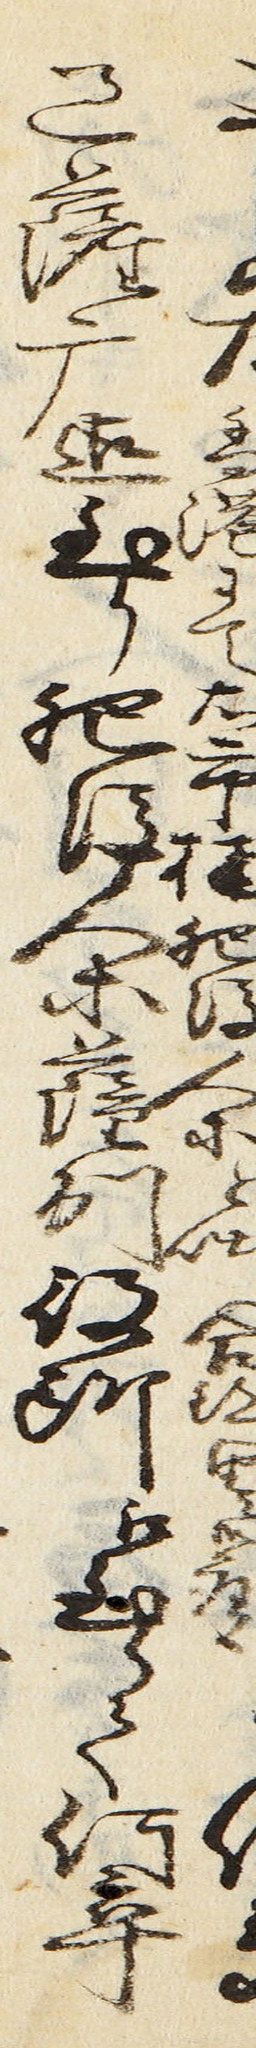過薩摩迄至り肥後人等薩州役所え至りて何卒
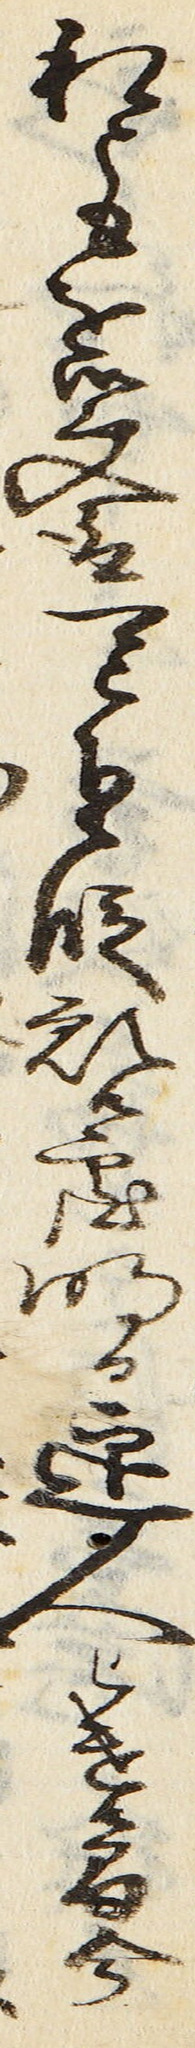私ともを御受取可被下候段願候処明日迎人被遣候間今
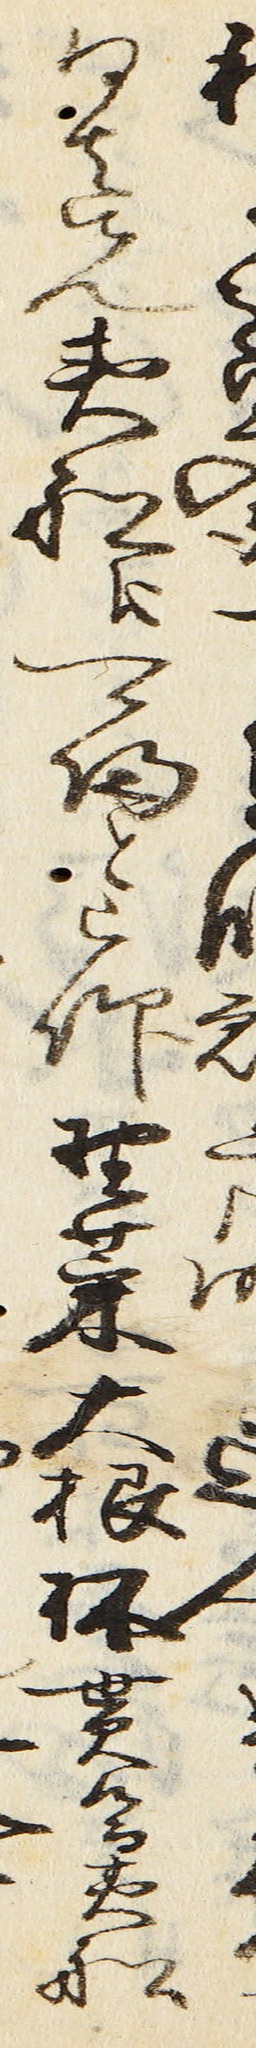日は先夷船え可帰と被仰野菜大根抔貰ける夷船
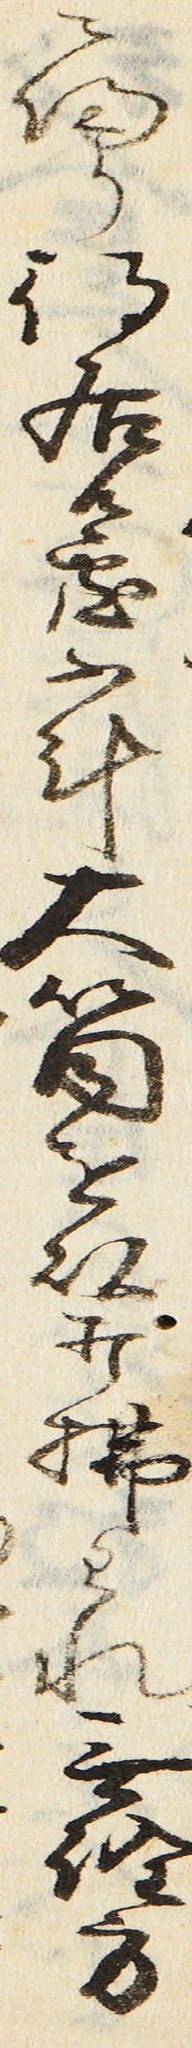ニ帰り待居候処不計大筒を以打払われ無詮方
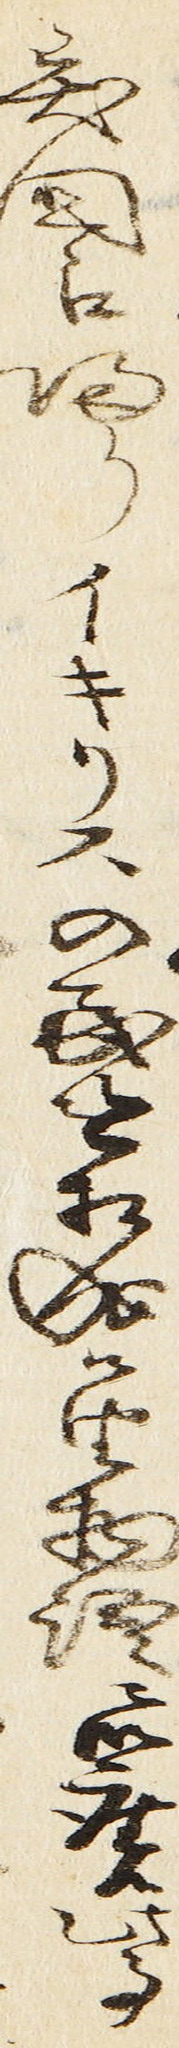異国え帰りイキリスの民と相成候由物語ニ御座候此事
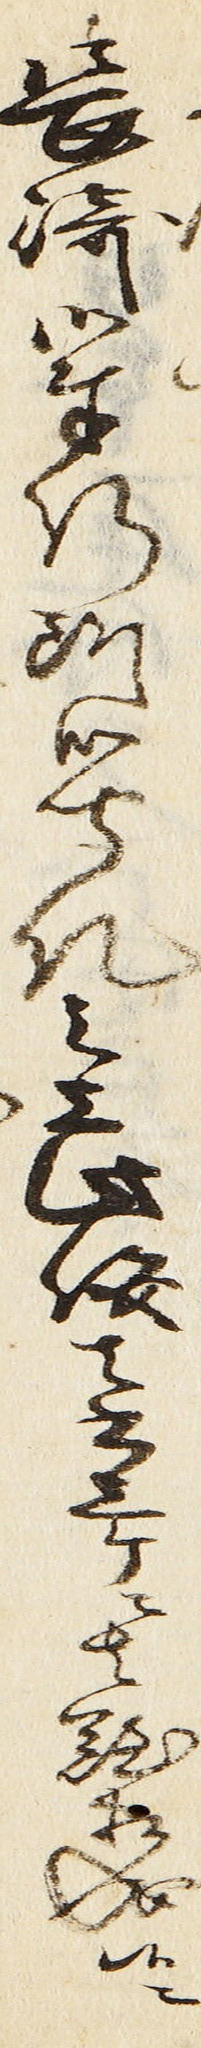長崎御奉行所御聞糺之上此儀は書上ケニは難相成候ニ
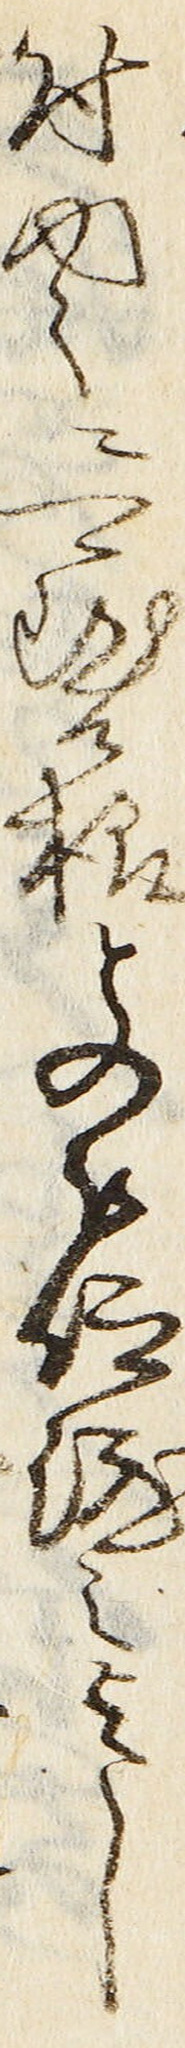付内々ニ可致候様との被仰渡之よし
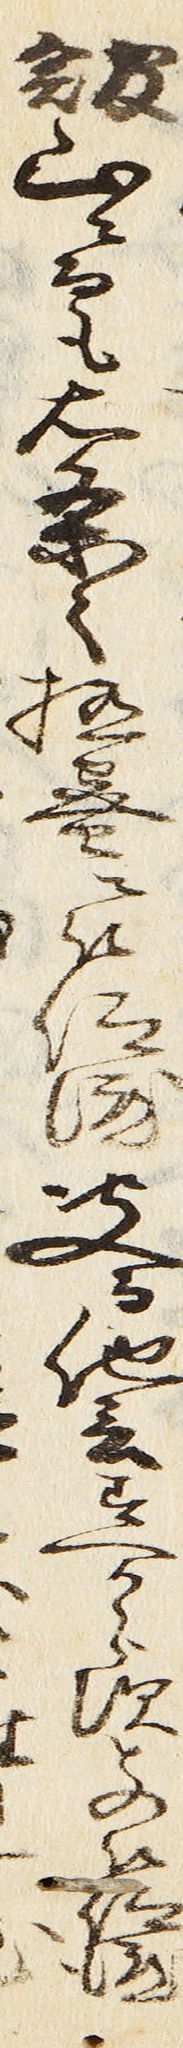館山ニ而も右条々極蜜ニ被仰渡決而他言すへからすとの被仰渡
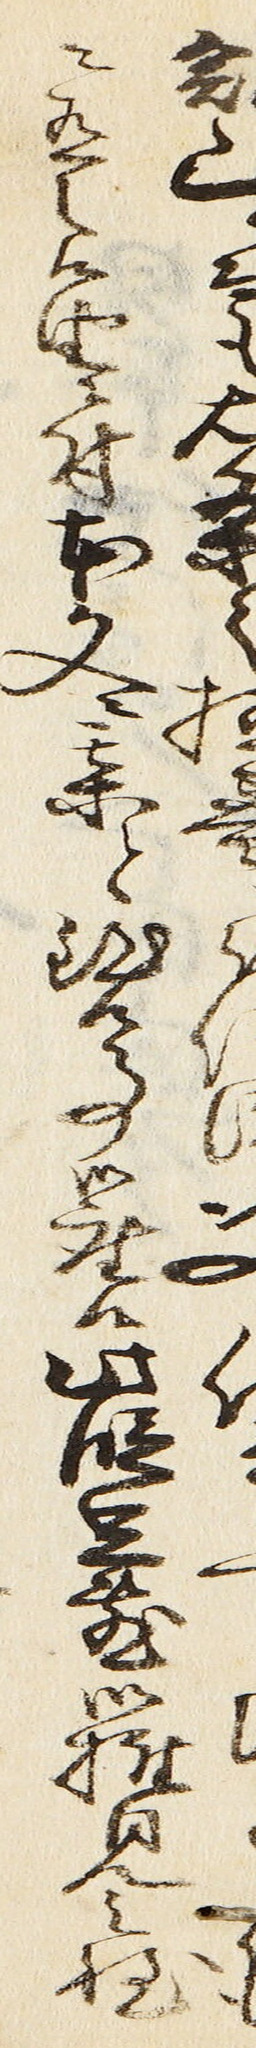ニ有之候由ニ付本文ニ某と致候事御座候此段足敷御推見之程
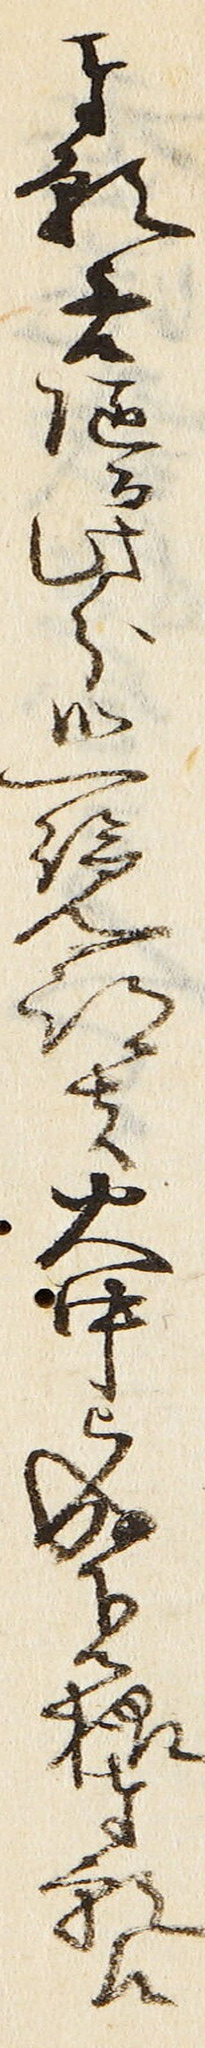奉願上候随而此分御一覧跡ニ者火中被成下候様奉願候
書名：亜墨利加漂流記聞
